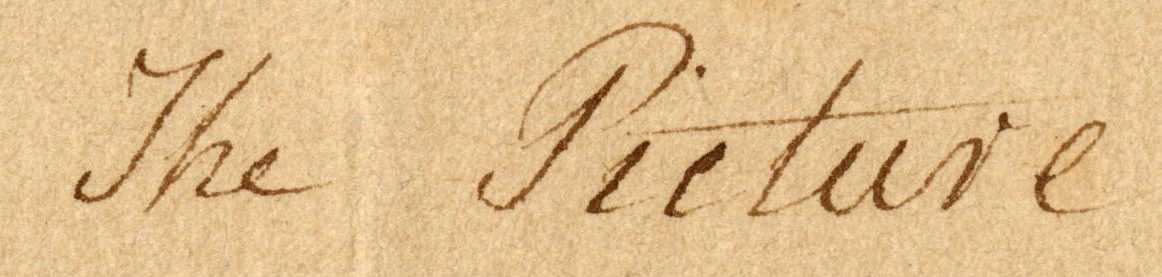The Picture
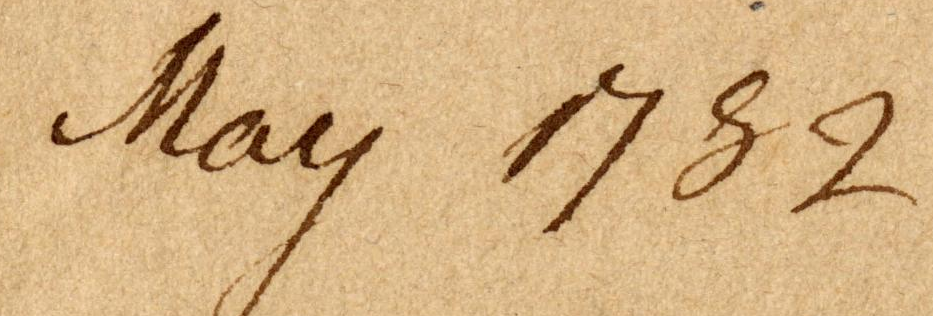May 1782
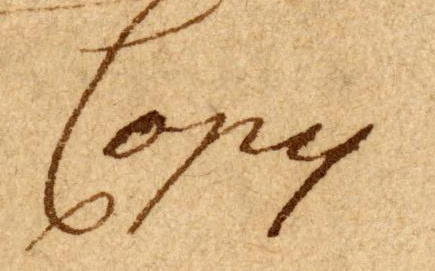Copy
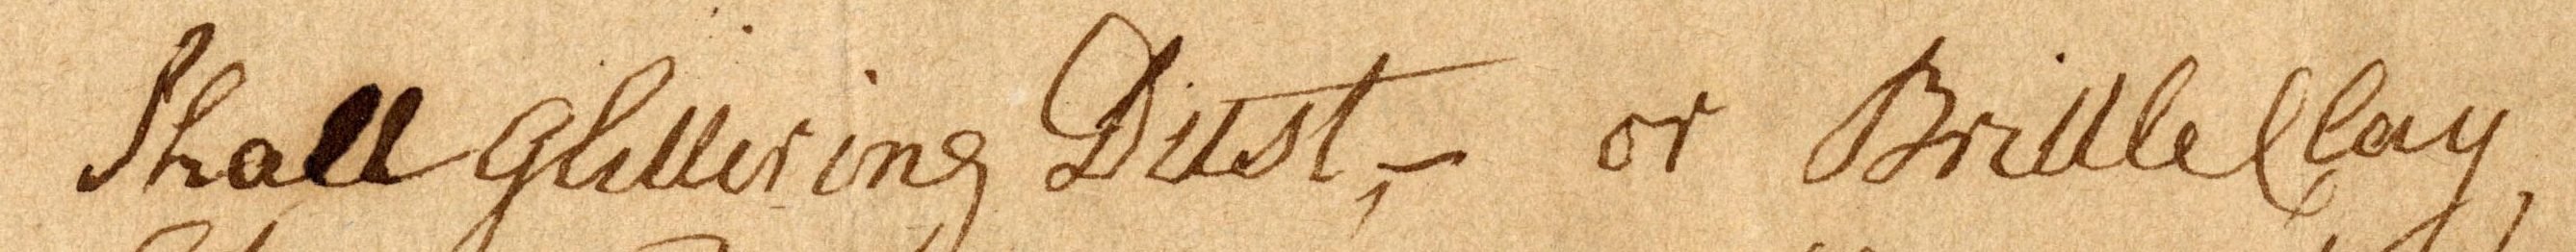Shall glittering Dust- or Brittle Clay,
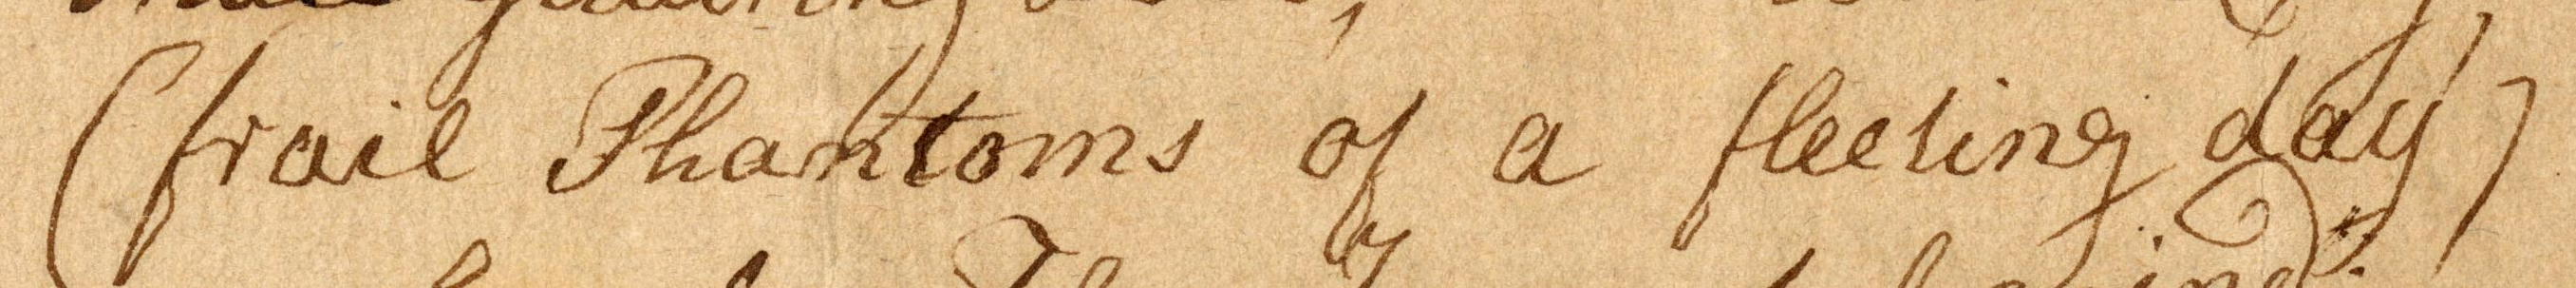(frail Phantoms of a fleeting day)
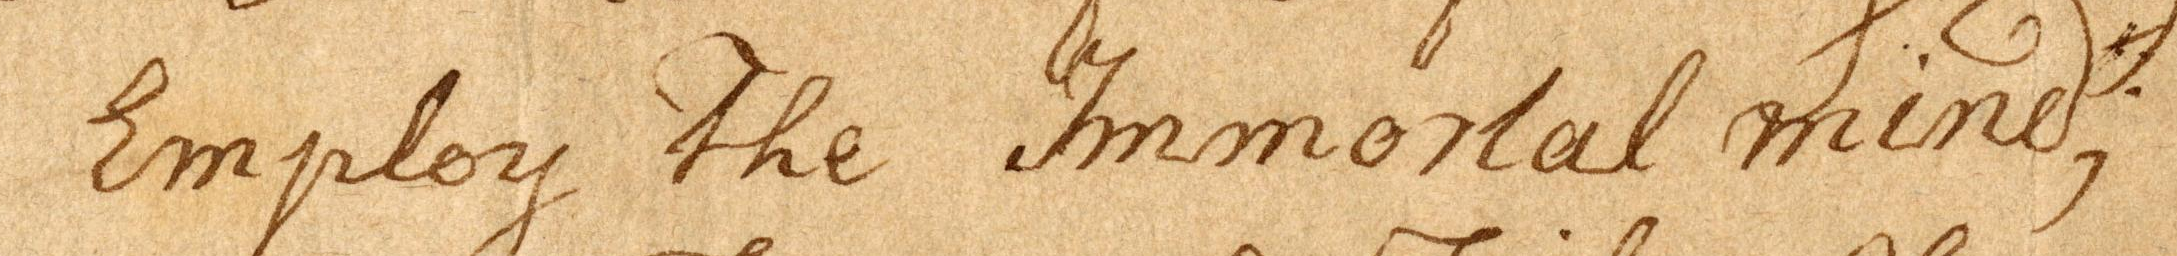Employ the Immortal mind;
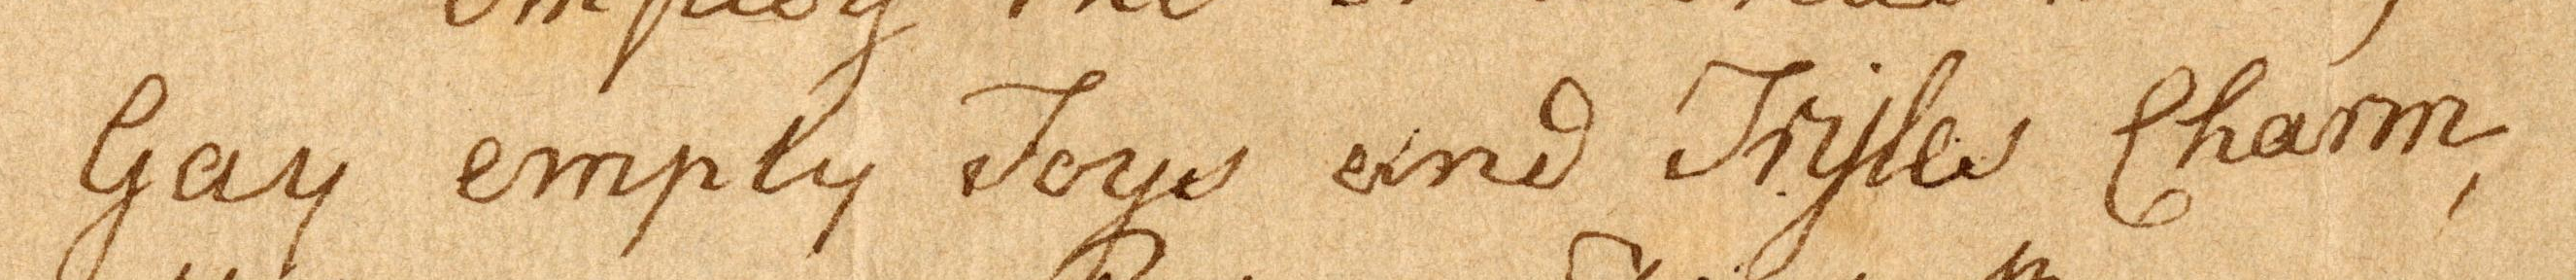Gay empty Toys and Trifles Charm,
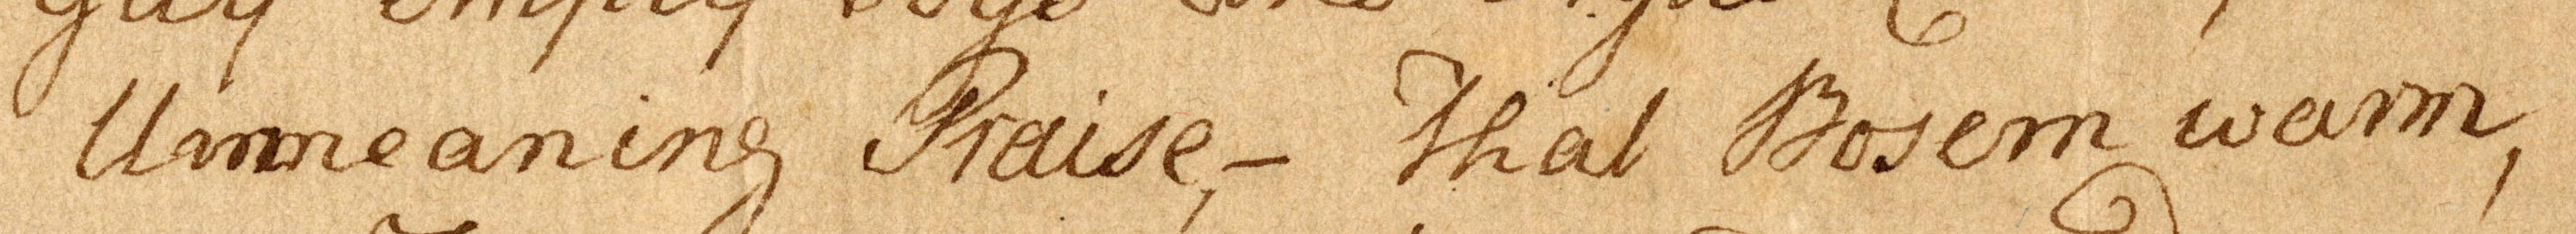Unmeaning Praise- That Bosem warm,
